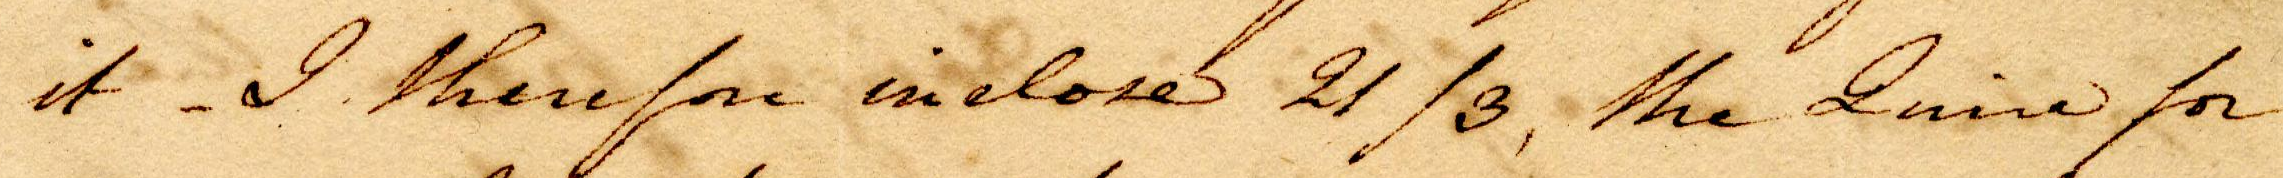it. I therefore inclose 21s3, the Quire for
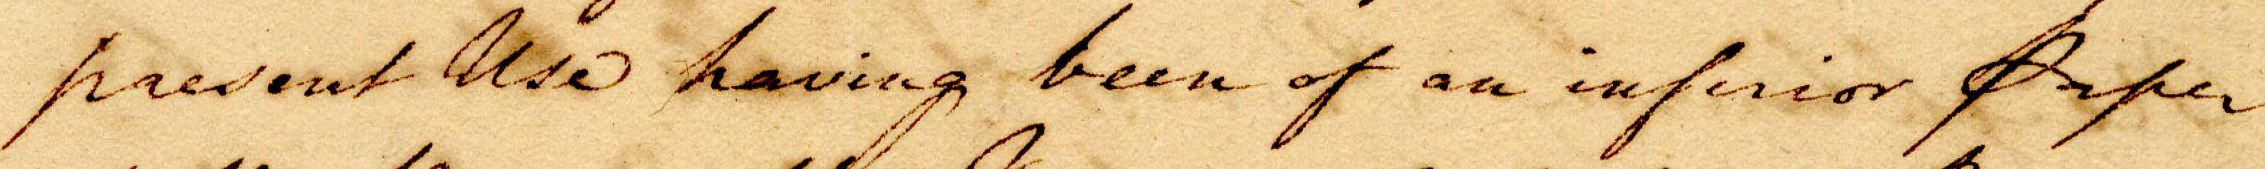present Use having been of an inferior Paper
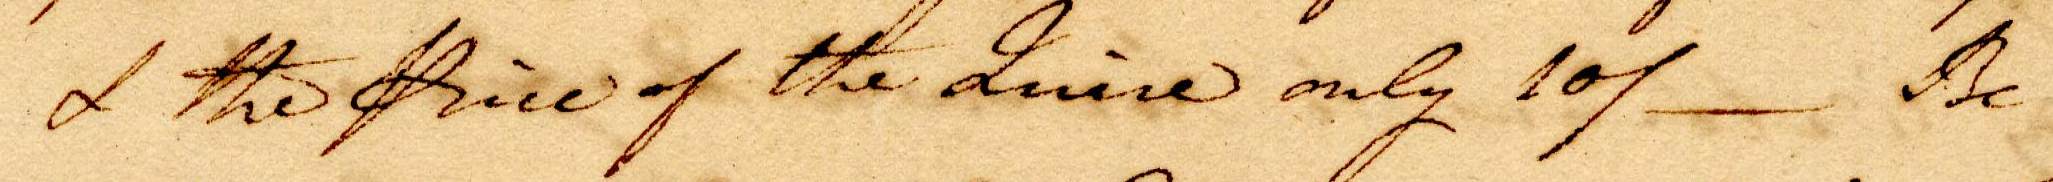& the Price of the Quire only 10s- Be
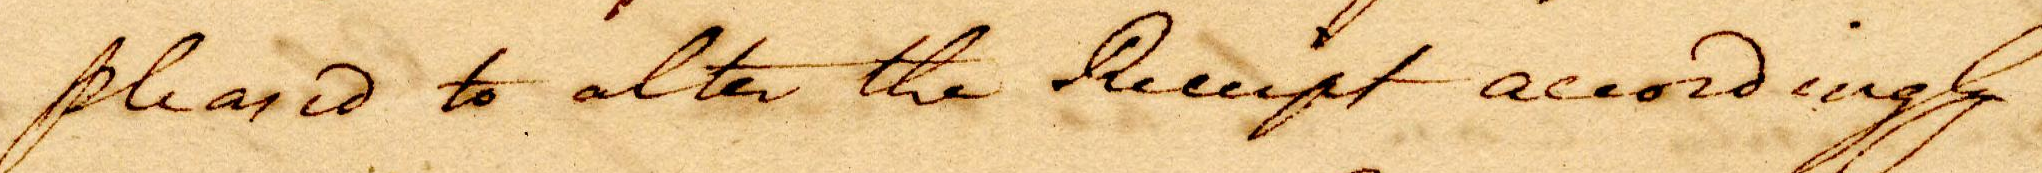pleased to alter the Receipt accordingly
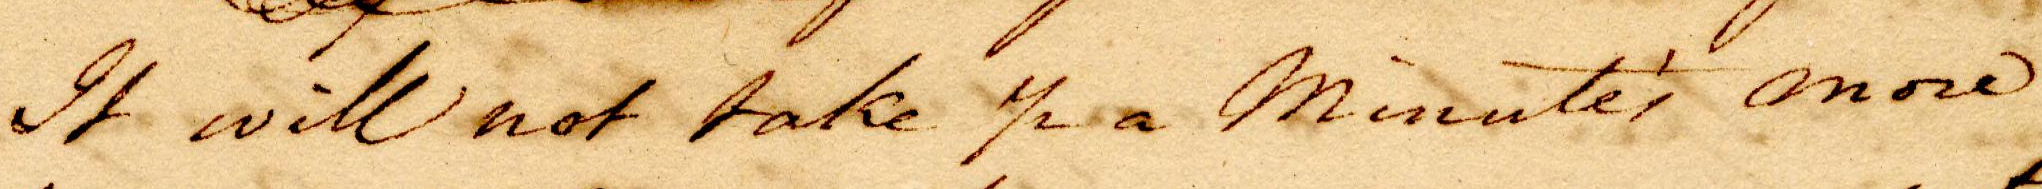It will not take 1/2 a Minute's more
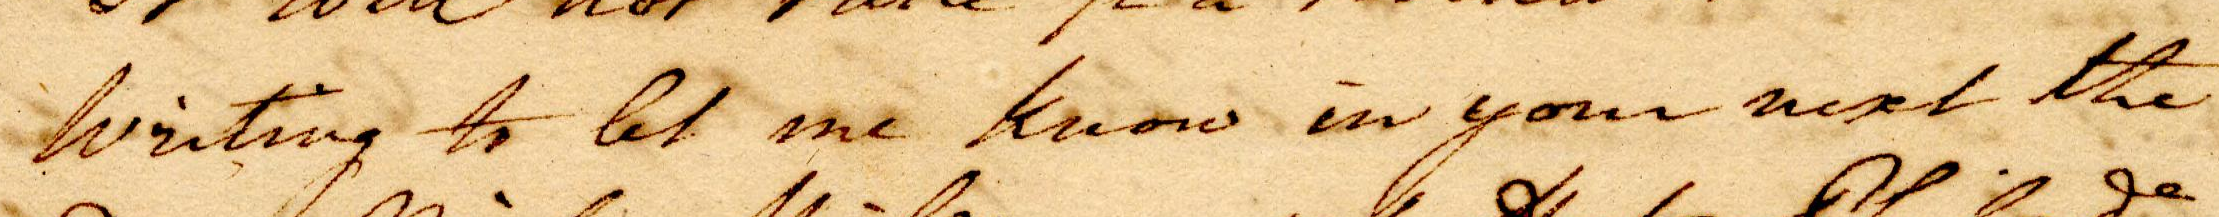Writing to let me know in your next the
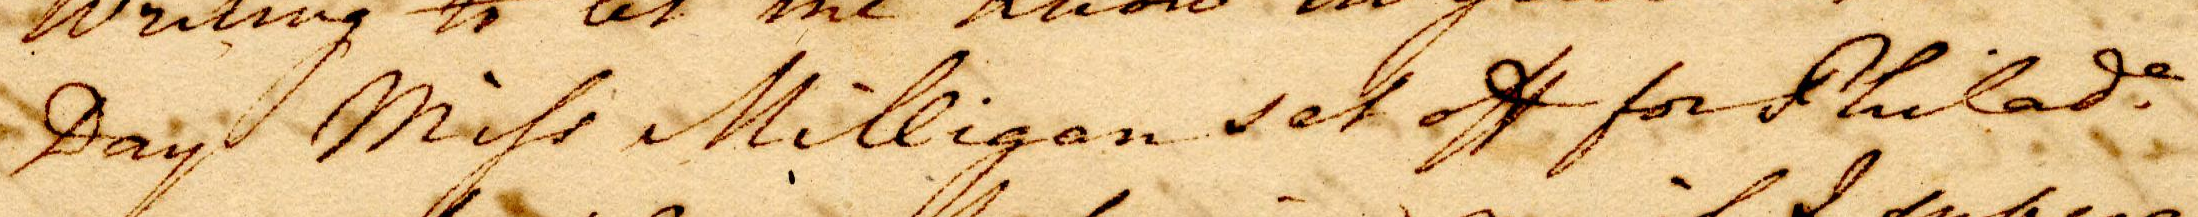Day Miss Milligan set off for Philad^a.
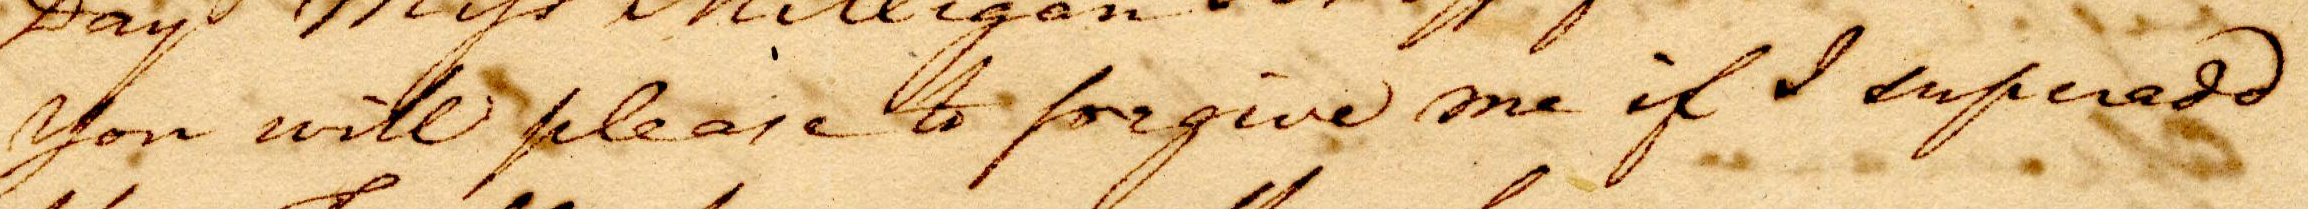You will please to forgive me if I superadd
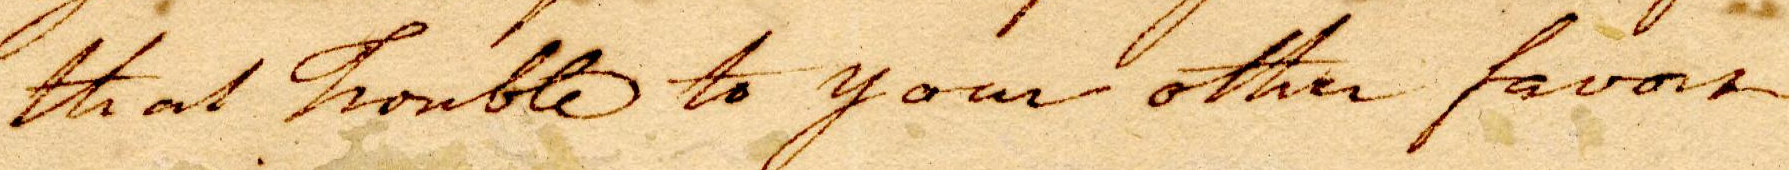that Trouble to your other favors
